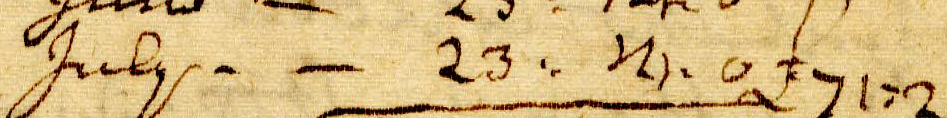July 23.14.0
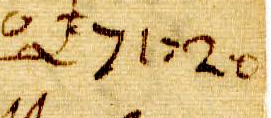£71:12
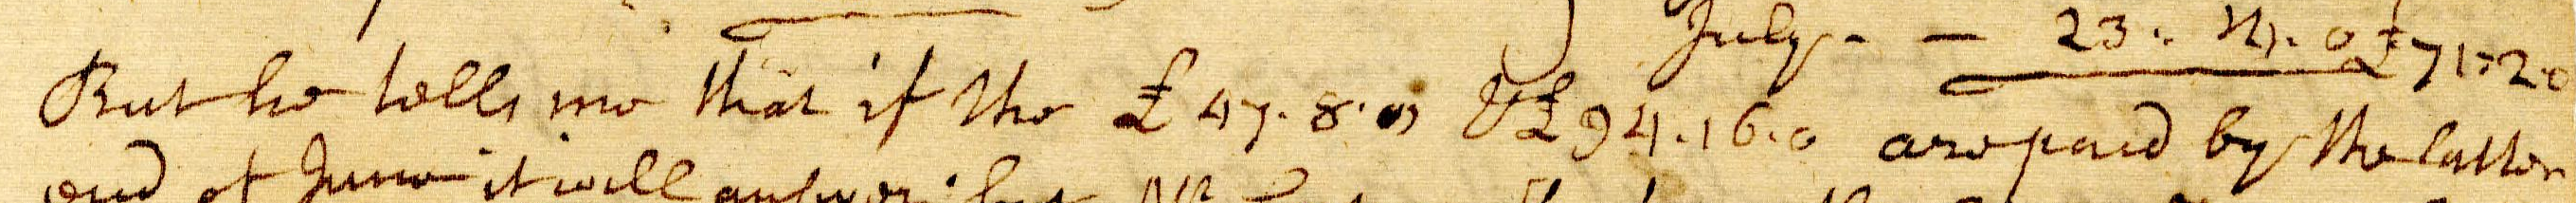But he tells me that if the £47.8.0 & £94.16.0 are paid by the latter
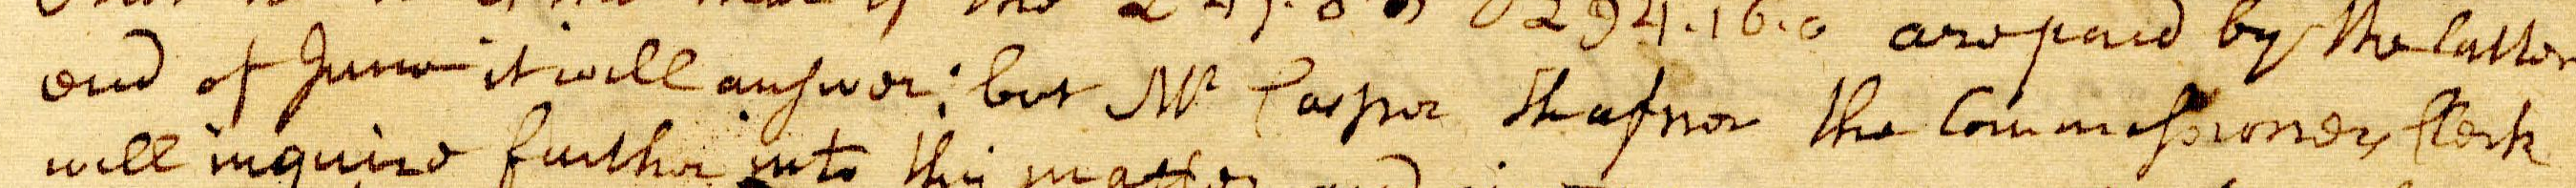end of June it will answer: but M^r Casper Shafner the Commissioners Clerk
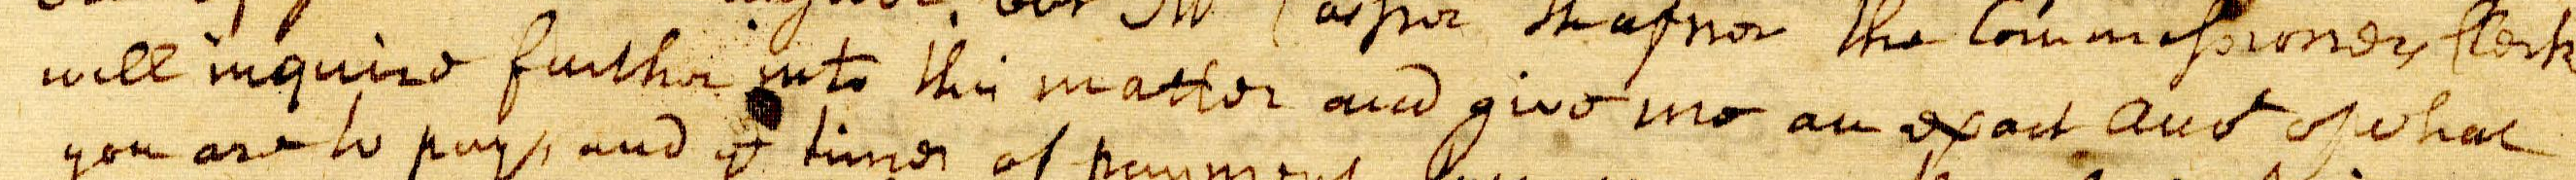will inquire further into this maker and give me an exact Acco^t of what
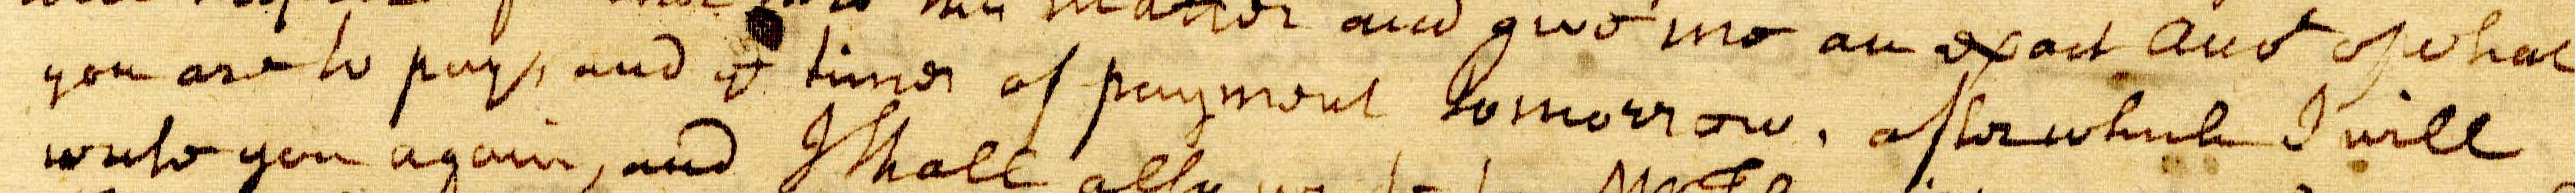you are to pay and y^e times of payment tomorrow. after which I will
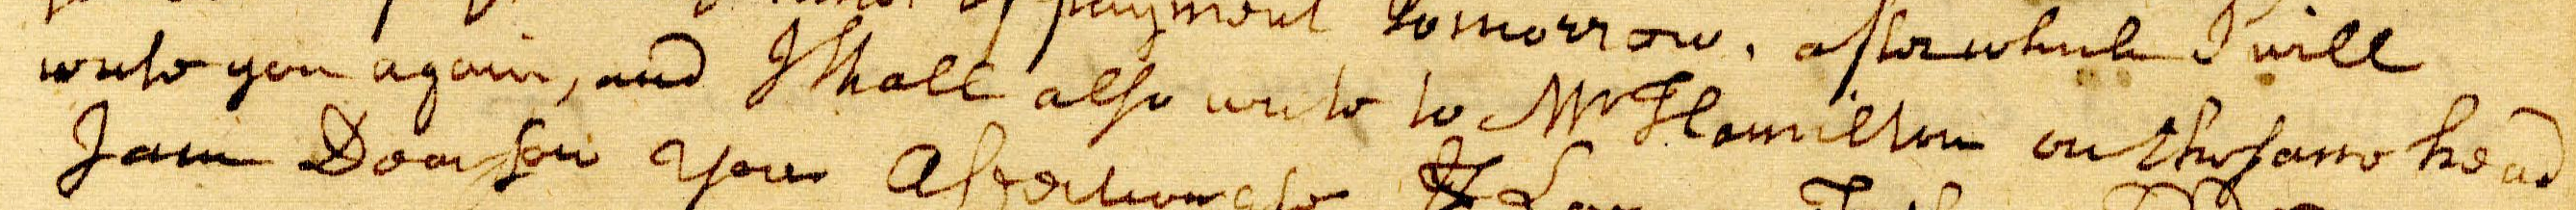write you again, and I shall also write to M^r Hamilton on the same head
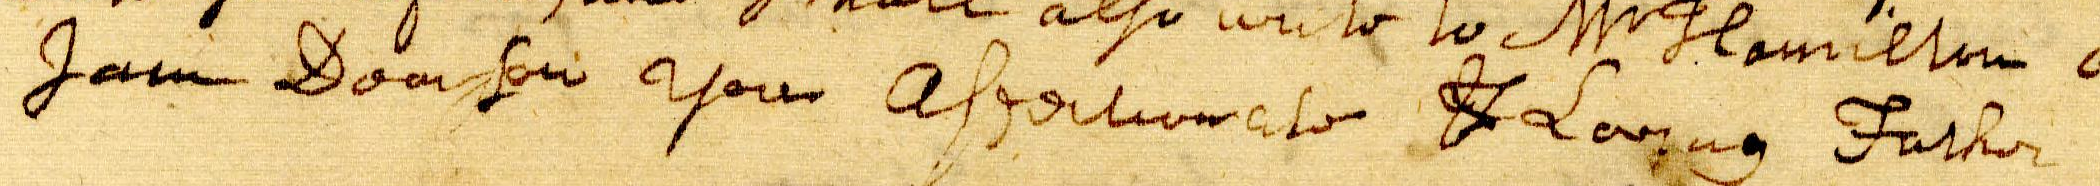I am Dear sir your affectionate & Loving Father
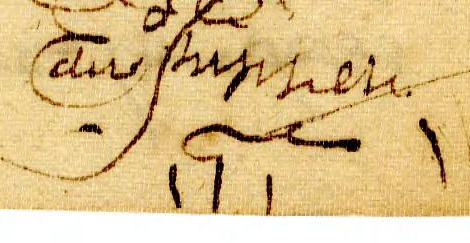Edw^d Shippen
